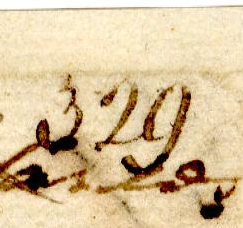329
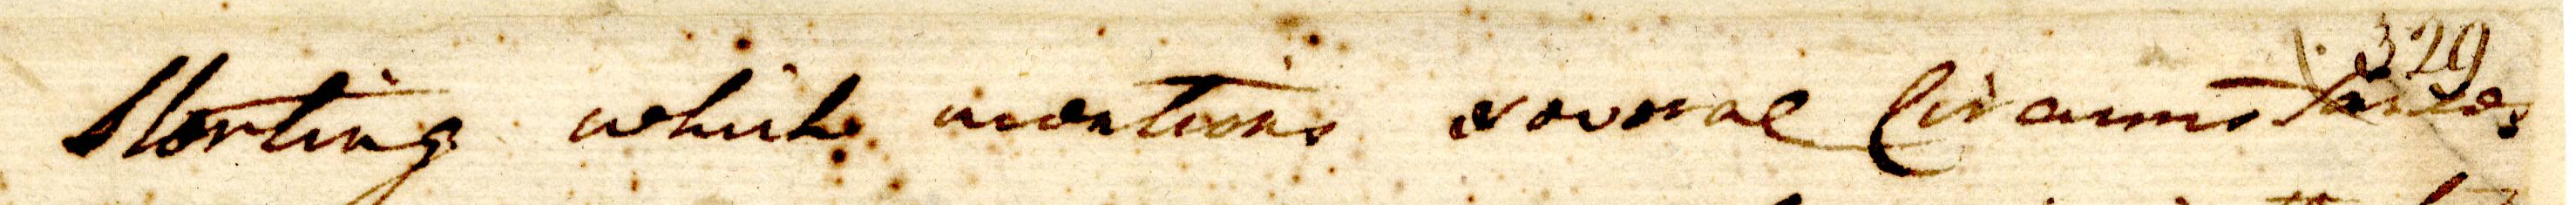starting which wash several Circumstances
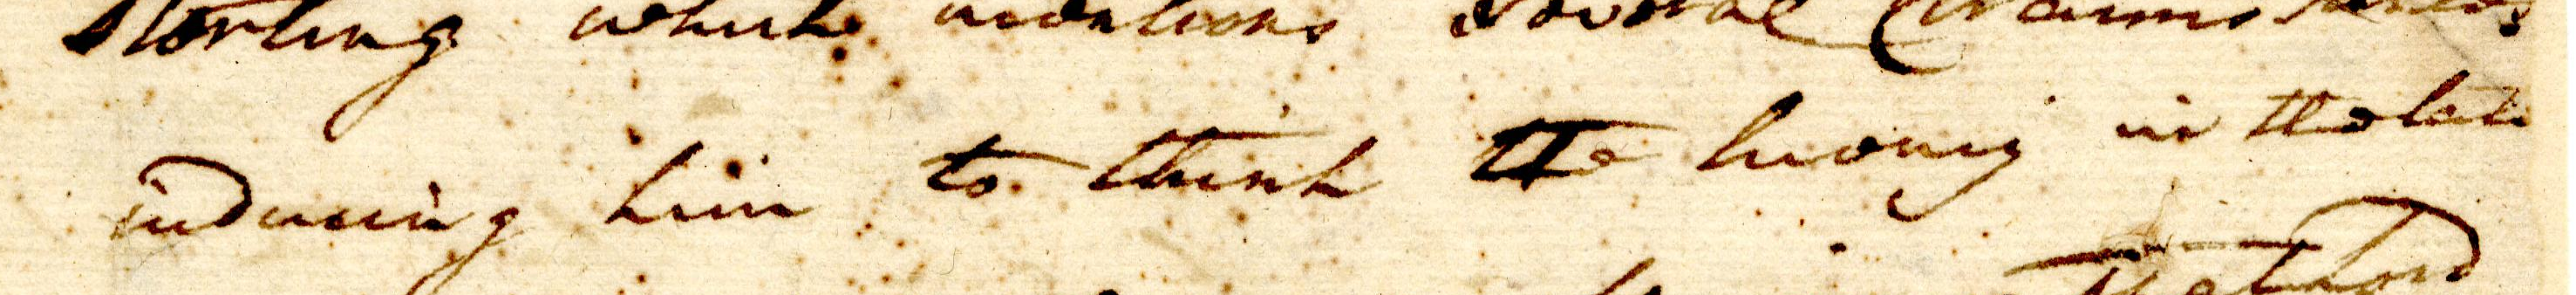induring him to think he being in the last
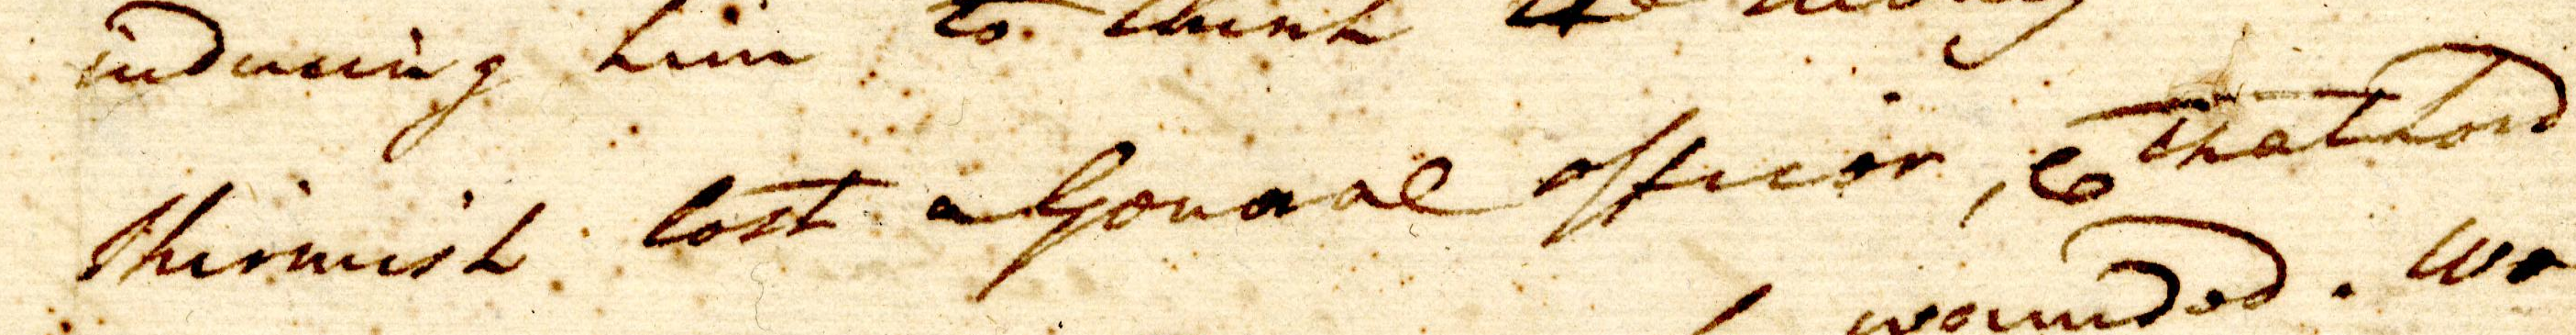skirmish lost a General officer & that Lord
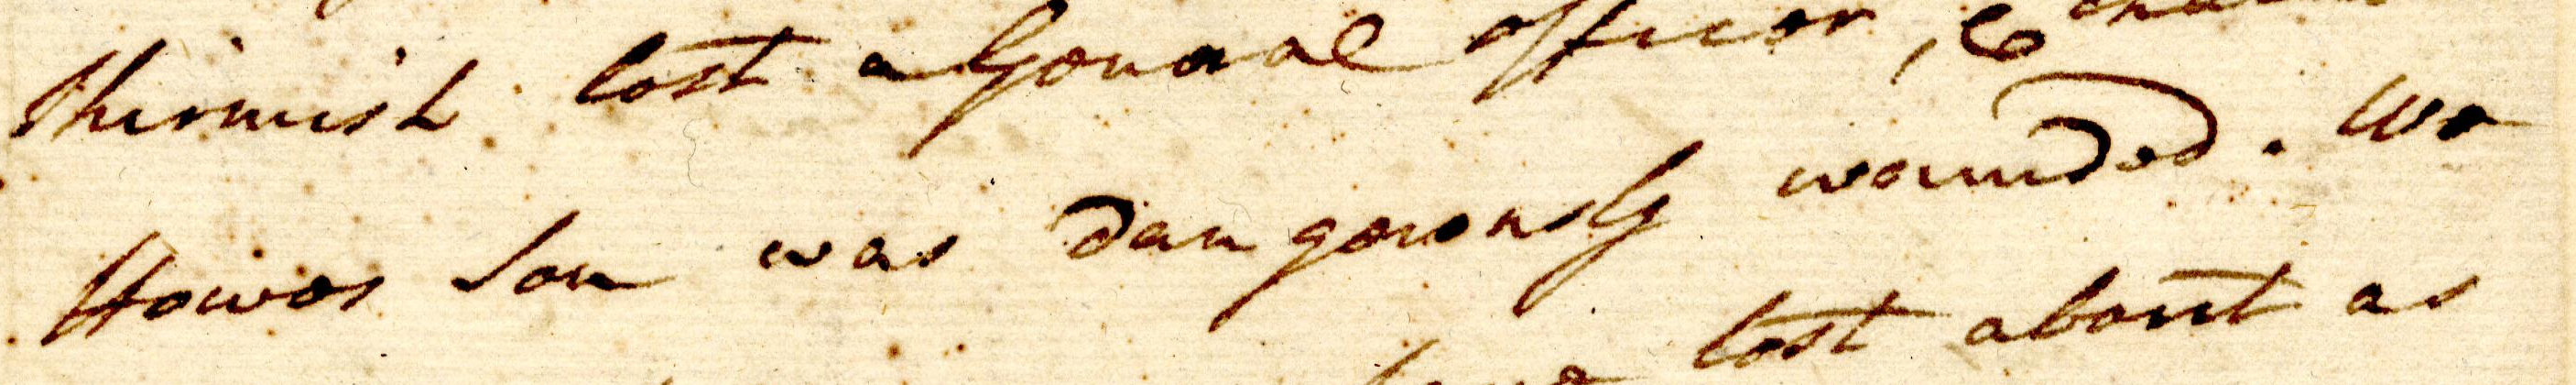Howe was dangerously wounded. We
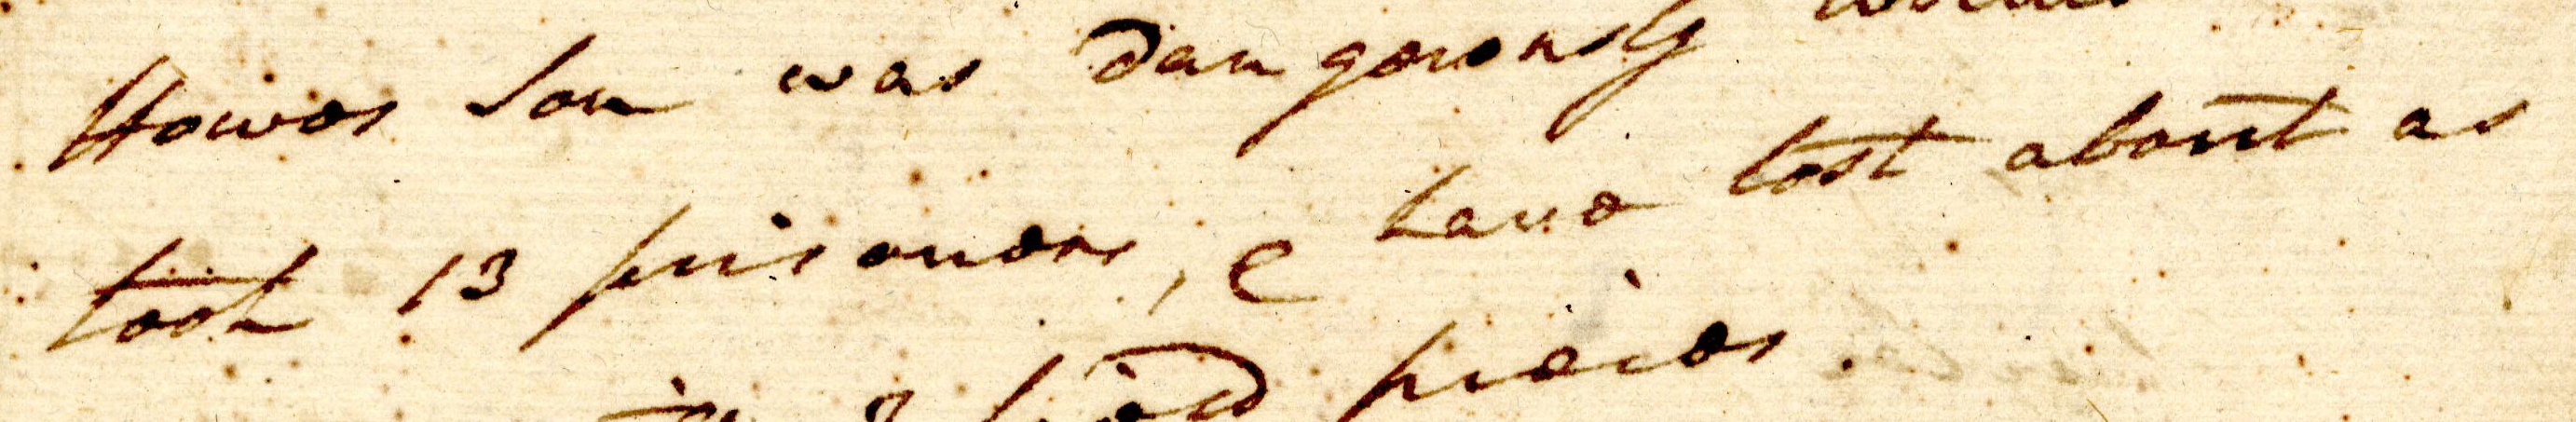took 13 prisoners; & have lost about as
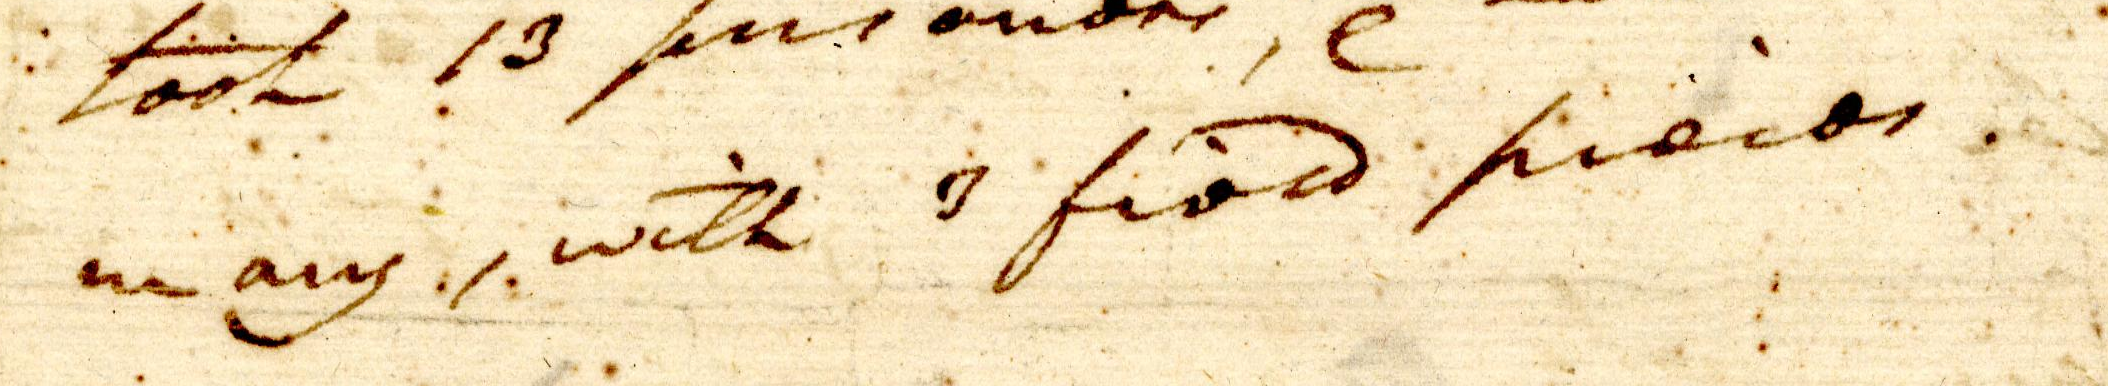many with3 field pieces.
